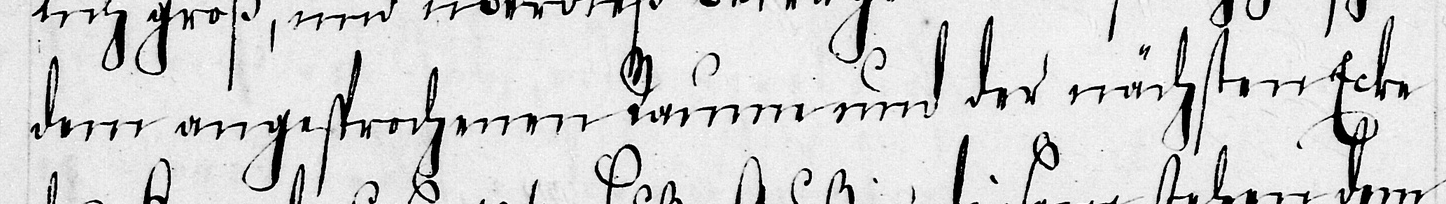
dem angesprochenen Raume und der nächsten Ecke
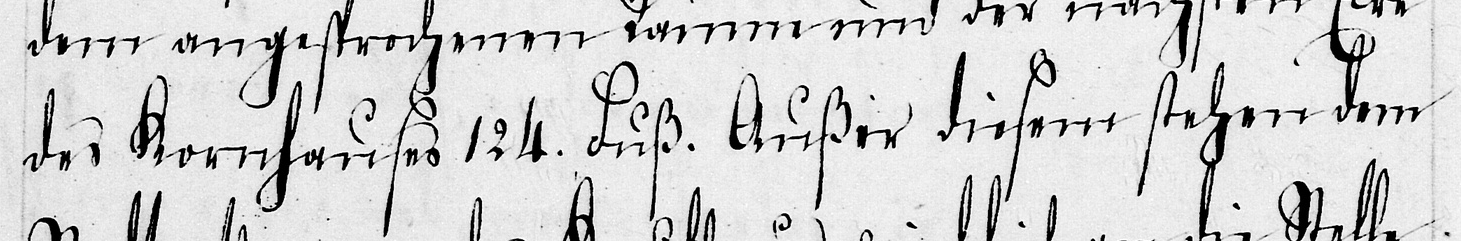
des Kornhauses 124. Fuß. Außer diesem stehen dem
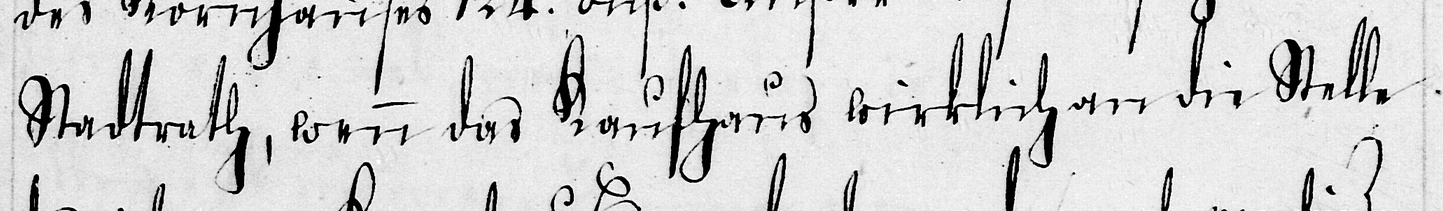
Stadtrath, wenn das Kaufhaus wirklich an die Stelle
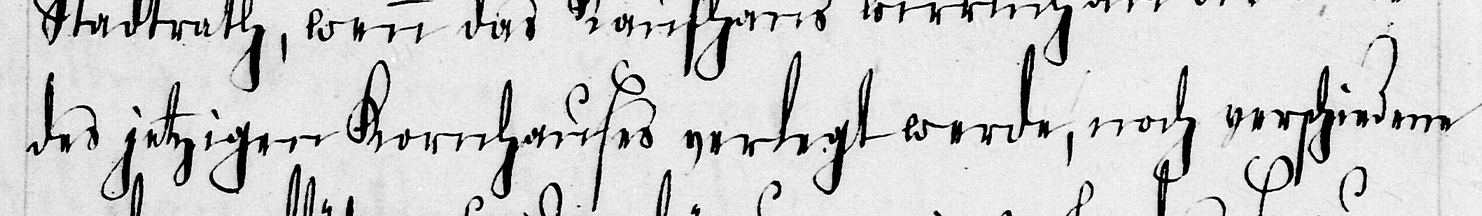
des jetzigen Kornhauses verlegt werde, noch verschiedene
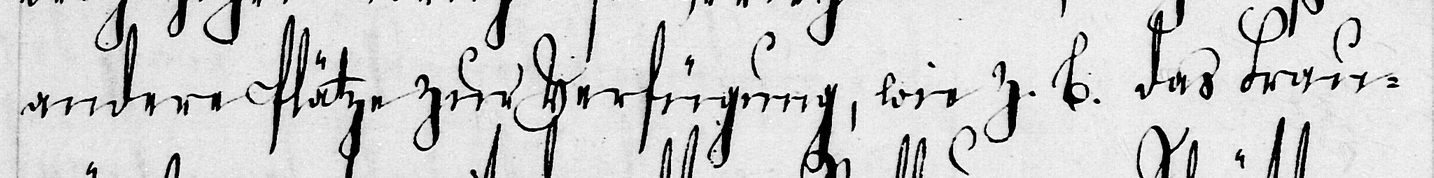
andere Plätze zur Verfügung, wie z. B. das Frau¬
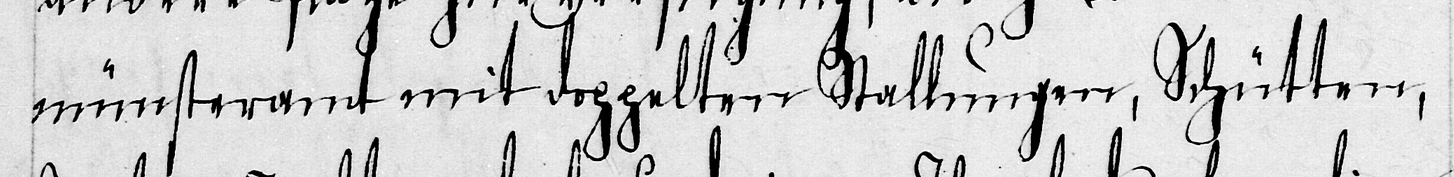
münsteramt mit doppelten Stellungen, Schütten,
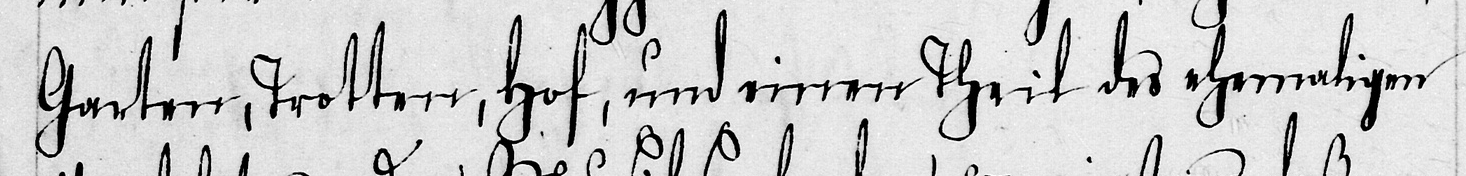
Garten, Trotten, Hof, und einem Theil des ehemaligen
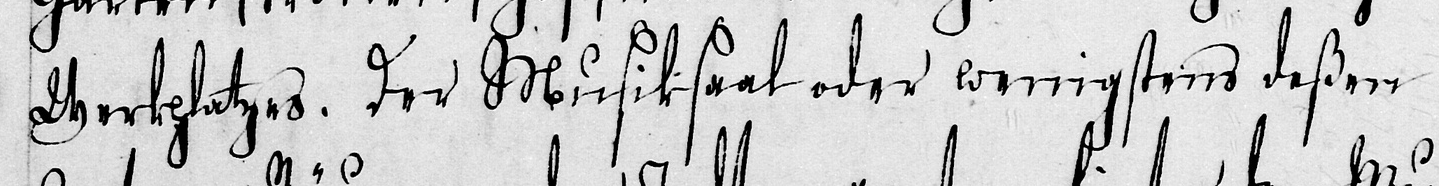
Werkplatzes. Der Musiksaal oder wenigstens deßen
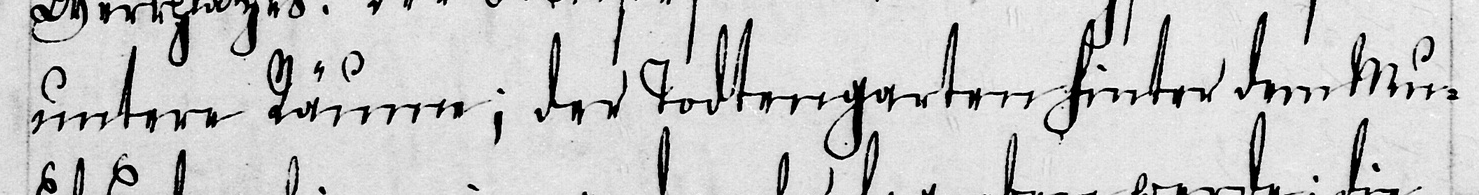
untere Räume; der Todtengarten hinter dem Mu¬
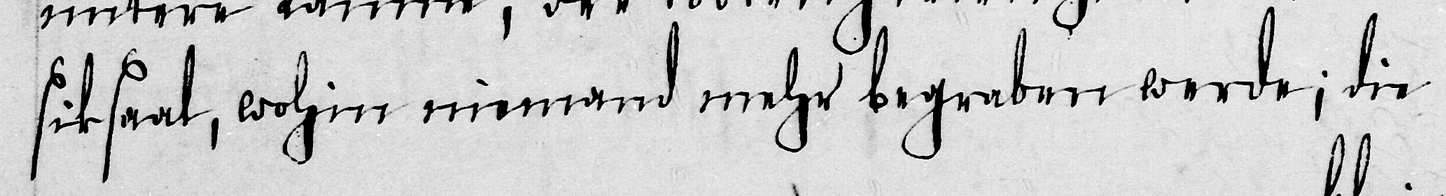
siksaal, wohin niemand mehr begraben werde; die
